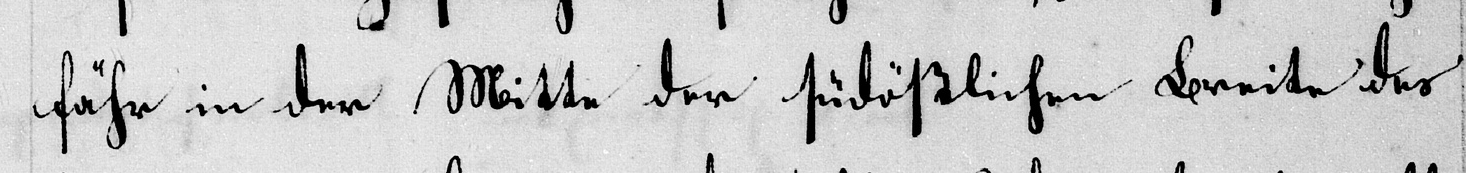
fähr in der Mitte der südöstlichen Breite des
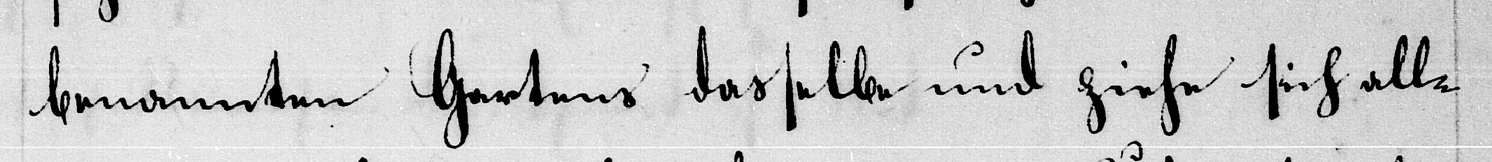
benannten Gartens dasselbe und ziehe sich all¬
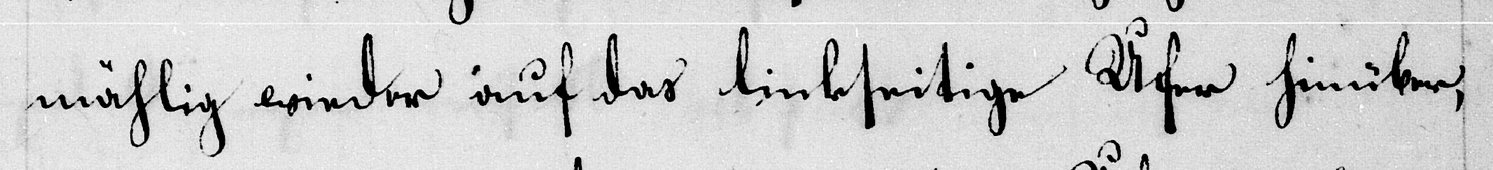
mählich wieder auf das linkseitige Ufer hinüber,
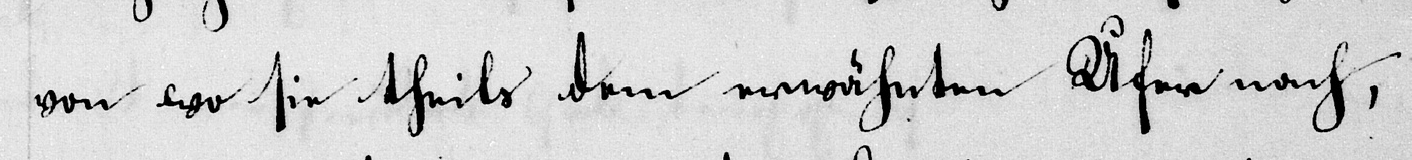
von wo sie theils dem erwähnten Ufer nach,
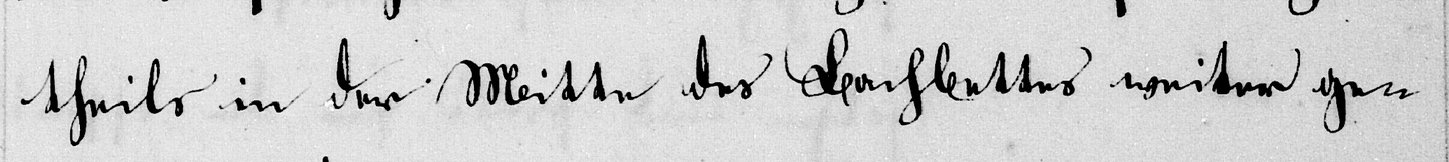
theils in der Mitte des Bachbettes weiter ge¬
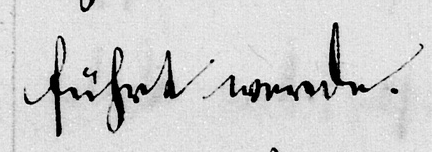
führt werde.
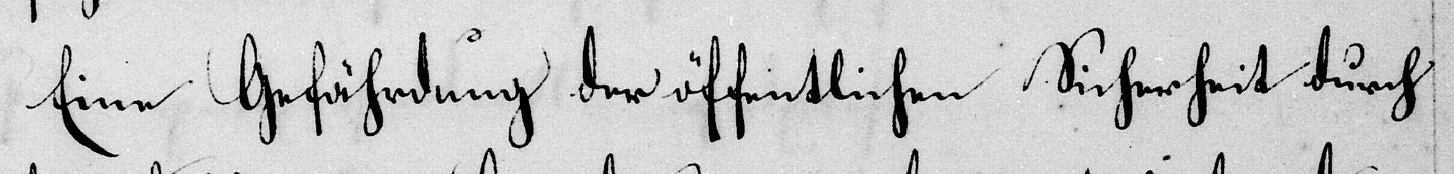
Eine Gefährdung der öffentlichen Sicherheit durch
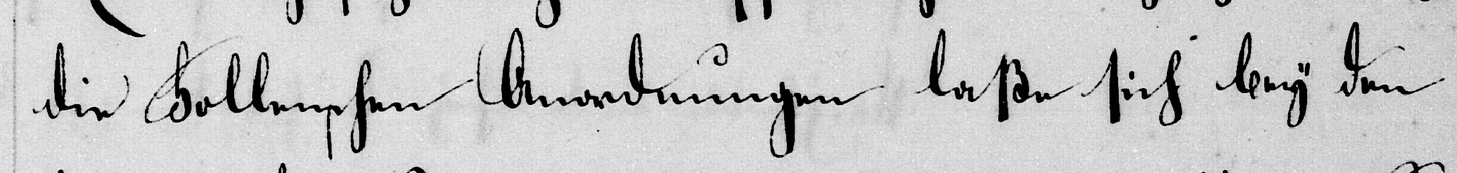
die Follenschen Anordnungen laße sich bey den
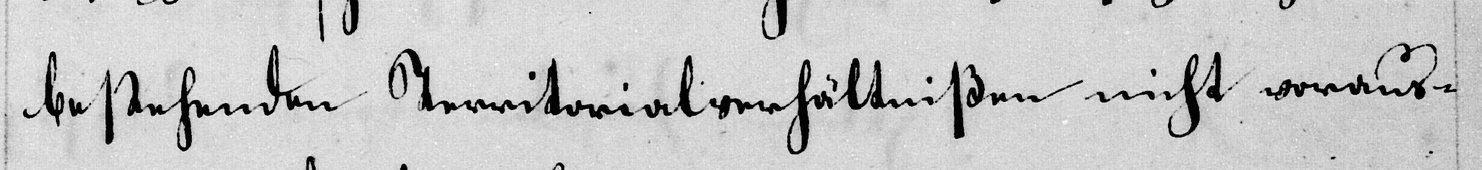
bestehenden Territorialverhältnißen nicht voraus¬
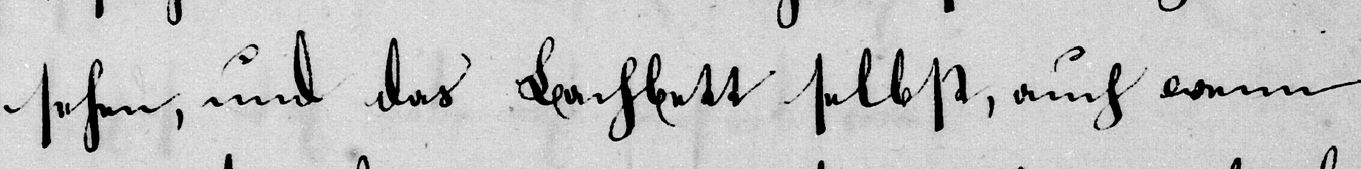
sehen, und das Bachbett selbst, auch wenn
